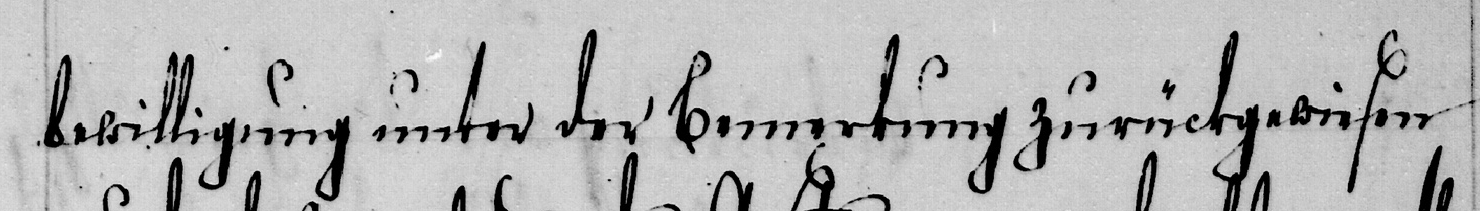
bewilligung unter der Bemerkung zurückgewiesen
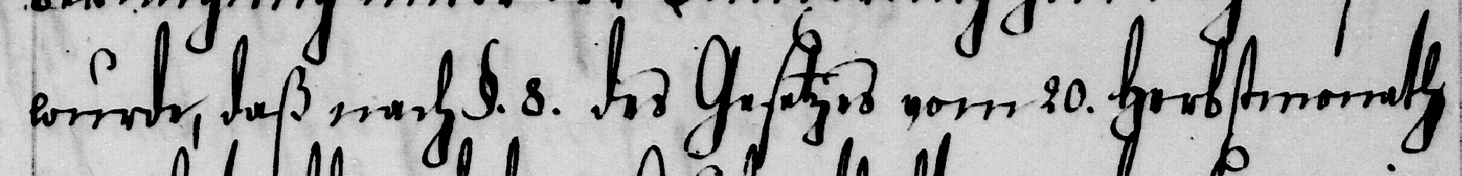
wurde, daß nach §. 8. des Gesetzes vom 20. Herbstmonath
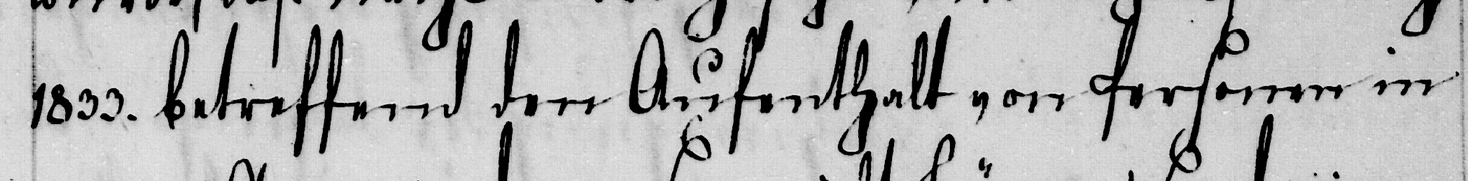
1833. betreffend den Aufenthalt von Personen in
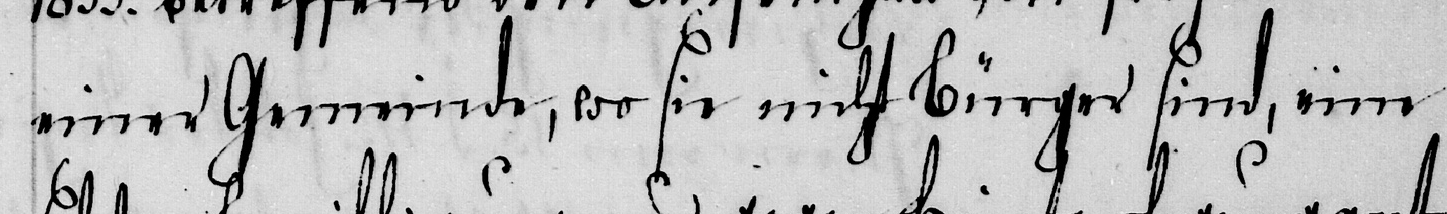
einer Gemeinde, wo sie nicht Bürger sind, eine
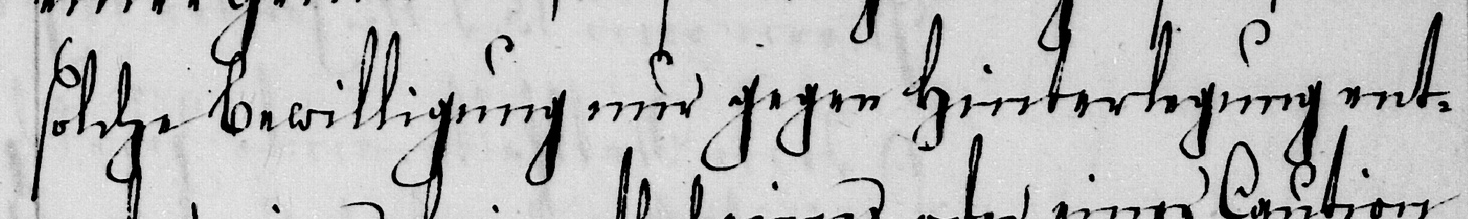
solche Bewilligung nur gegen Hinterlegung ent¬
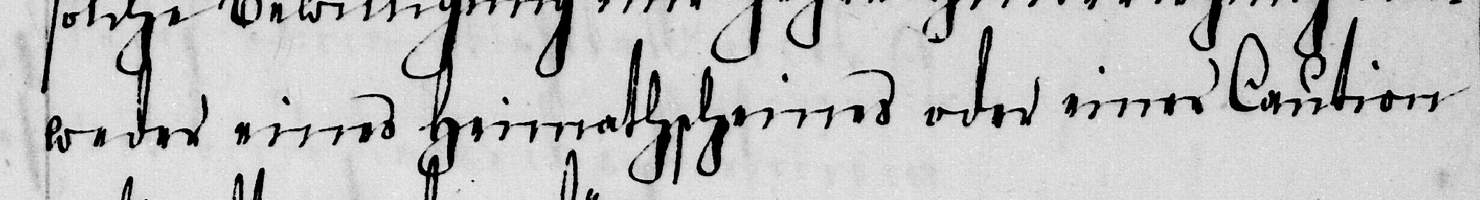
weder eines Heimathscheines oder einer Caution
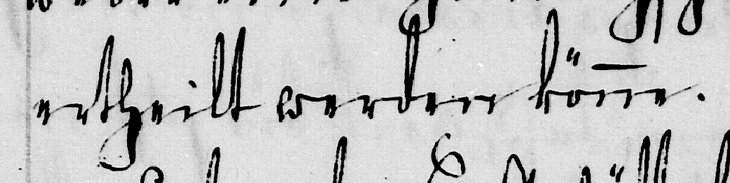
ertheilt werden könne.
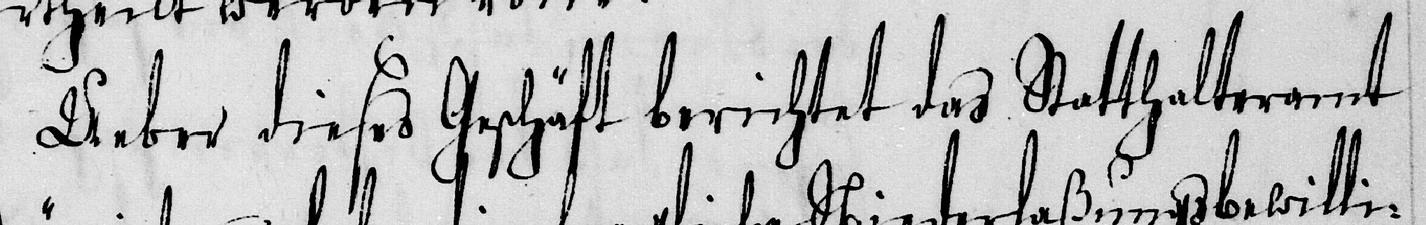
Ueber dieses Geschäft berichtet das Statthalteramt
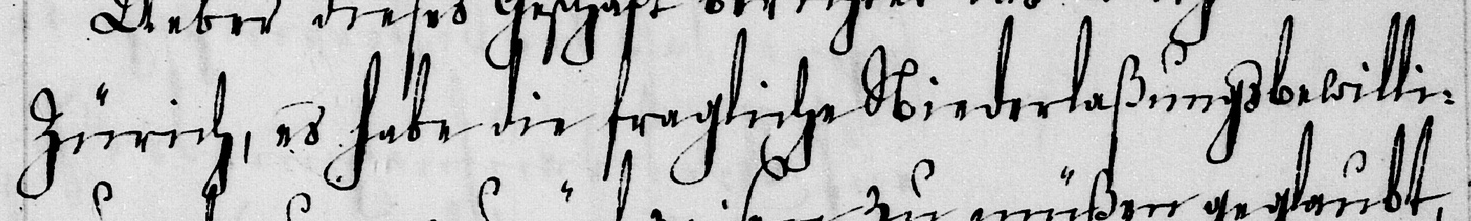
Zürich, es habe die fragliche Niederlaßungsbewilli¬
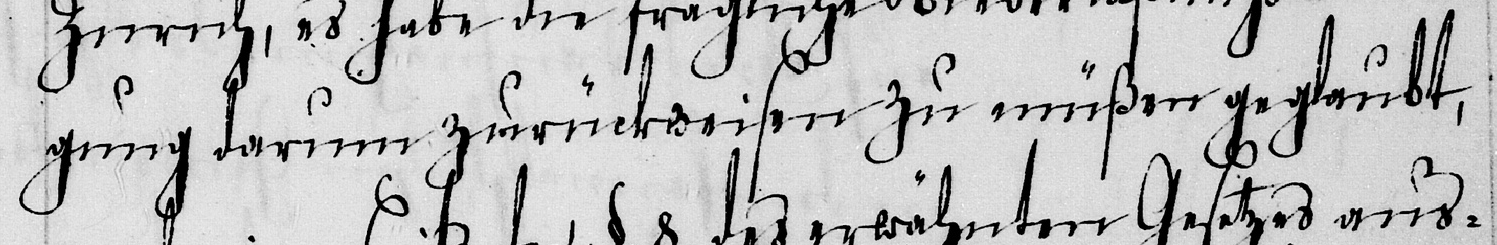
gung darum zurückweisen zu müßen geglaubt,
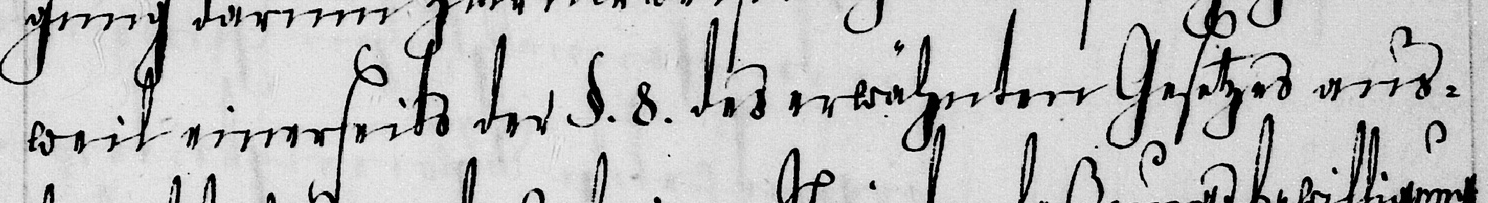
weil einerseits der §. 8. des erwähnten Gesetzes aus¬
